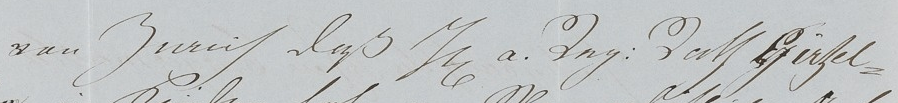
von Zurich daß Herr a. Reg:Rath Hirzel-
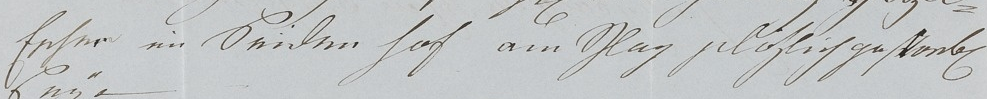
Escher im Seiden Hof am Schlag plötzlich gestorben
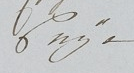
seye.
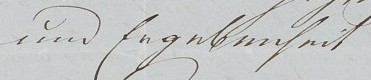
und Ergebenheit
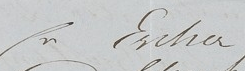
Cr Escher
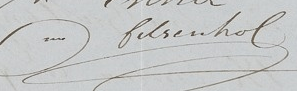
im Felsenhof
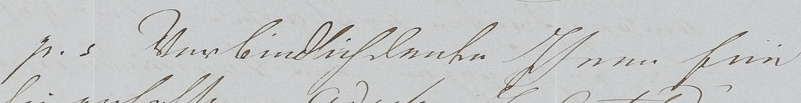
p. s. Verbindlich danke Ihnen für
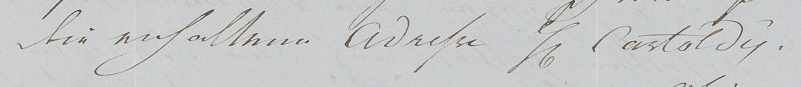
die erhaltene Adreße Herr Castoldis.
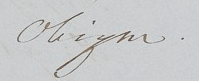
Obiger.
